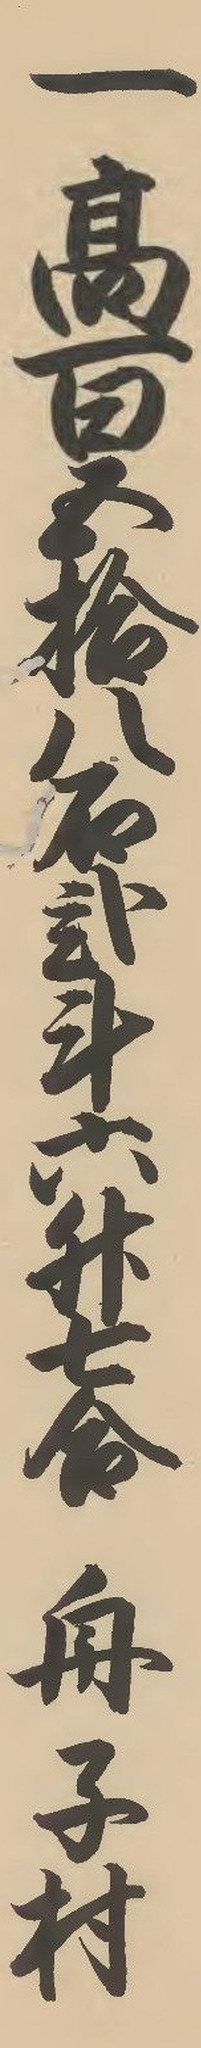一髙百五拾八石弐斗六升七合舟子村
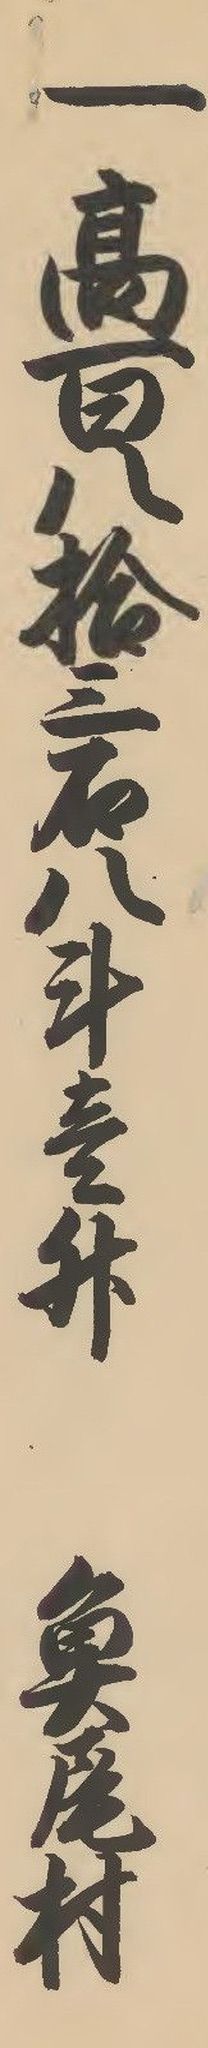一髙百八拾三石八斗壱升魚尾村
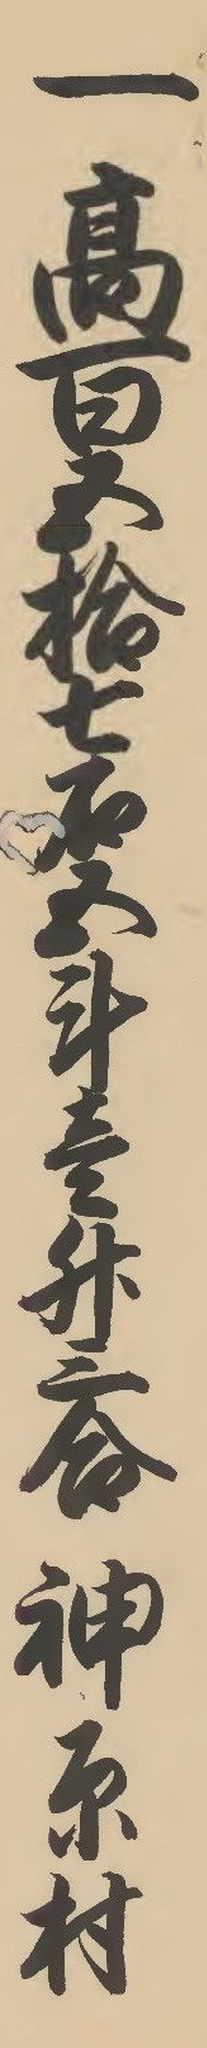一髙百五拾七石五斗壱升三合神原村
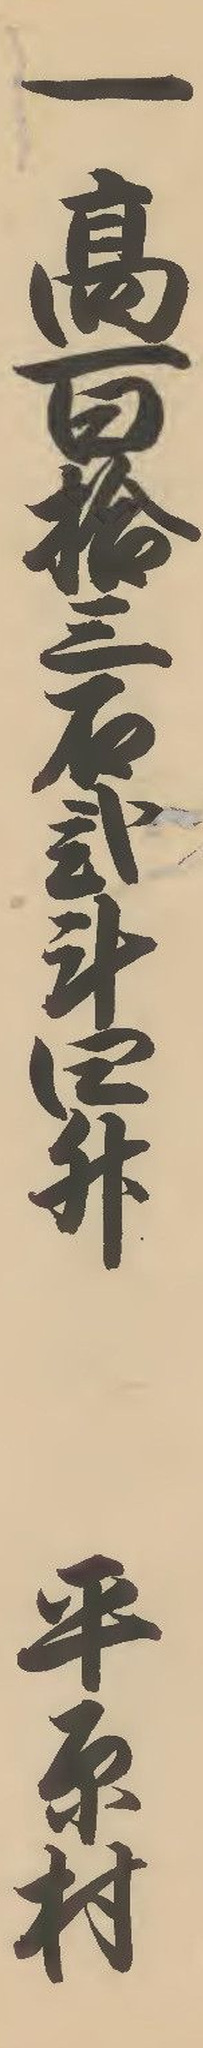一髙百拾三石弐斗四升平原村
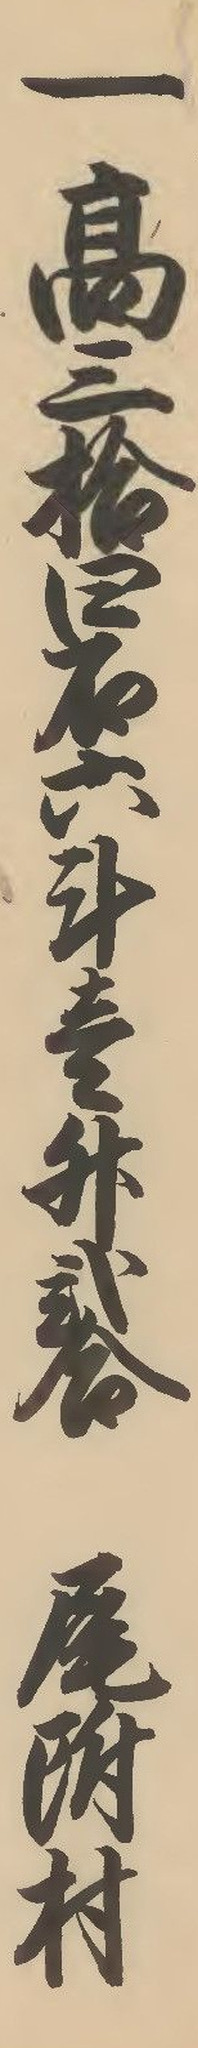一髙三拾四石六斗壱升弐合尾附村
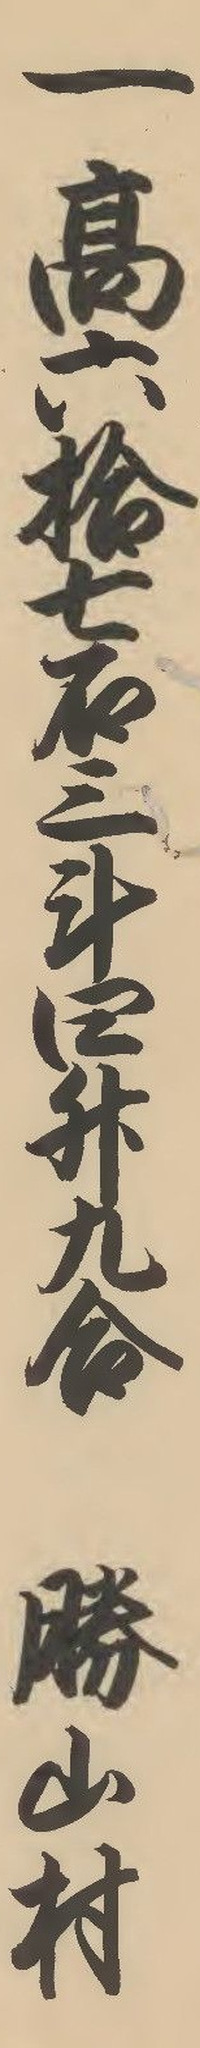一髙六拾七石三斗四升九合勝山村
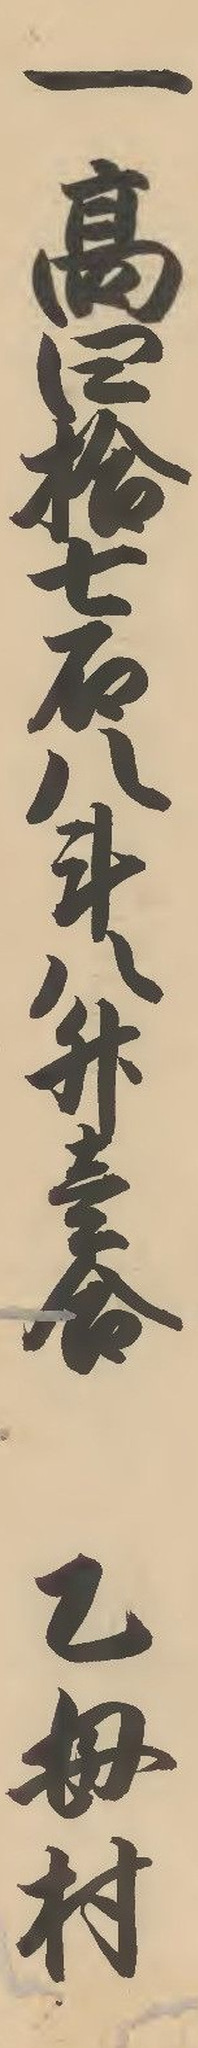一髙四拾七石八斗八升壱合乙母村

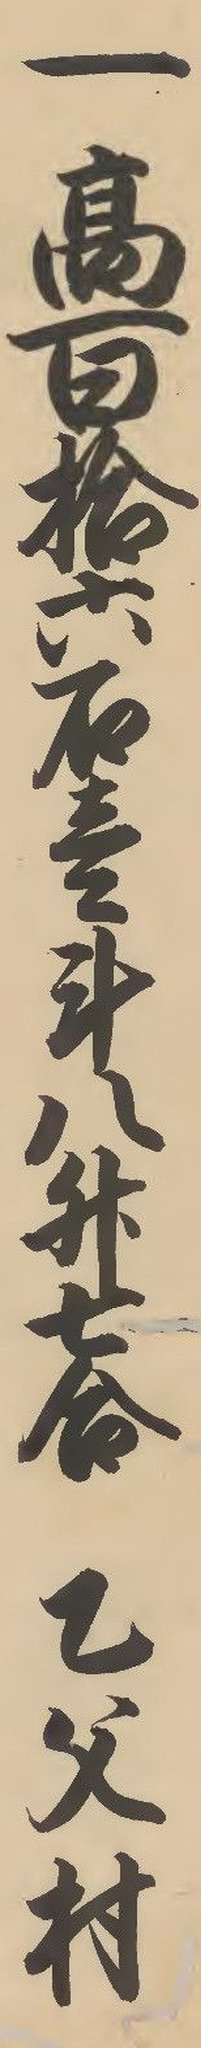一髙百拾六石壱斗八升七合乙父村
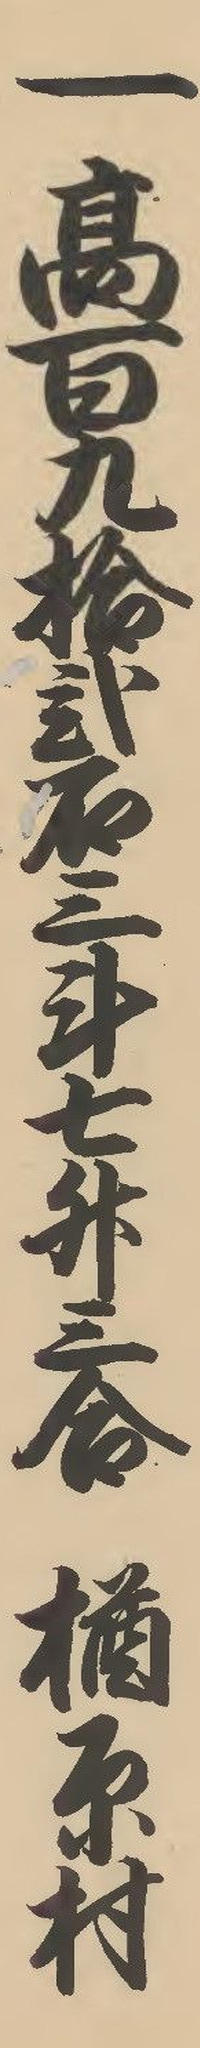一髙百九拾弐石三斗七升三合楢原村
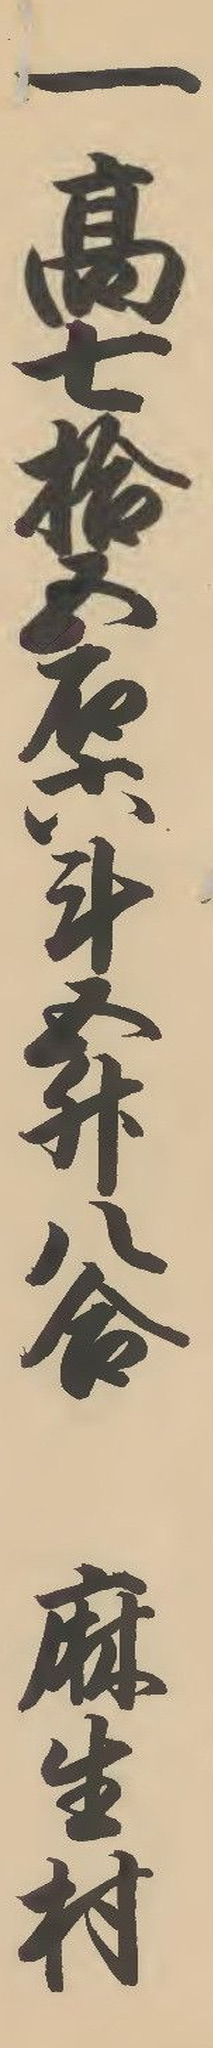一髙七拾五石六斗五升八合麻生村
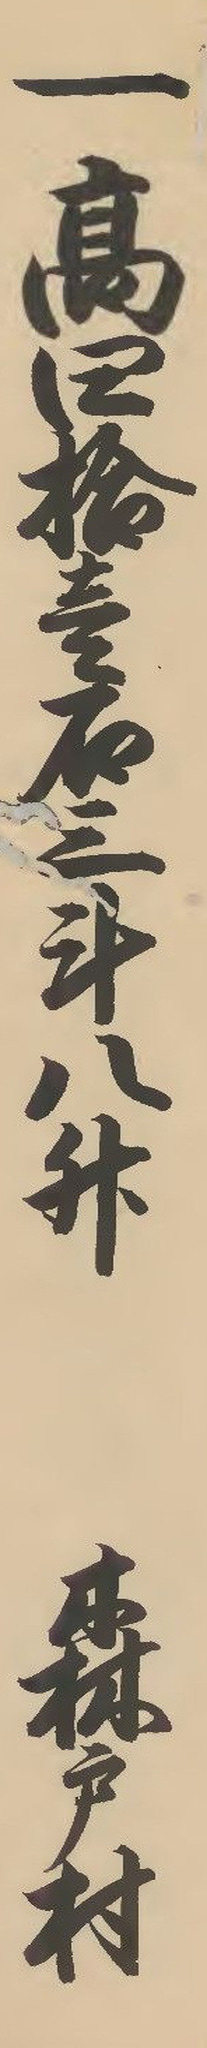一髙四拾壱石三斗八升森戸村
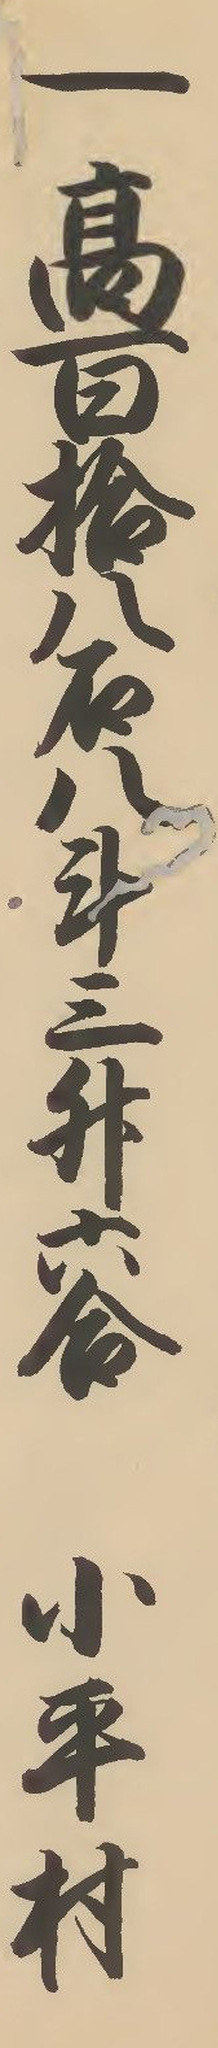一髙百拾八石八斗三升六合小平村
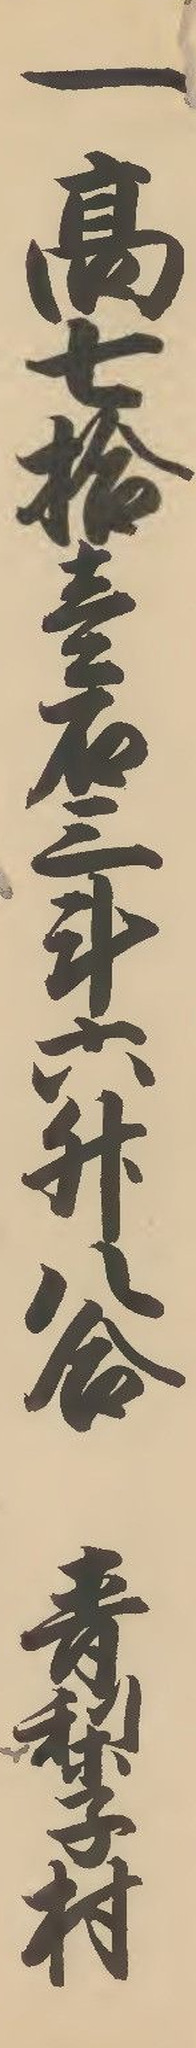一髙七拾壱石三斗六升八合青梨子村
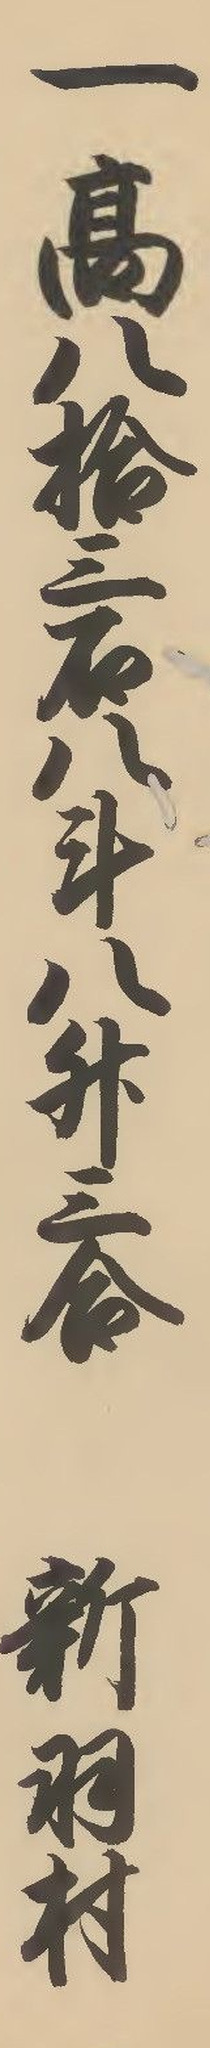一髙八拾三石八斗八升三合新羽村
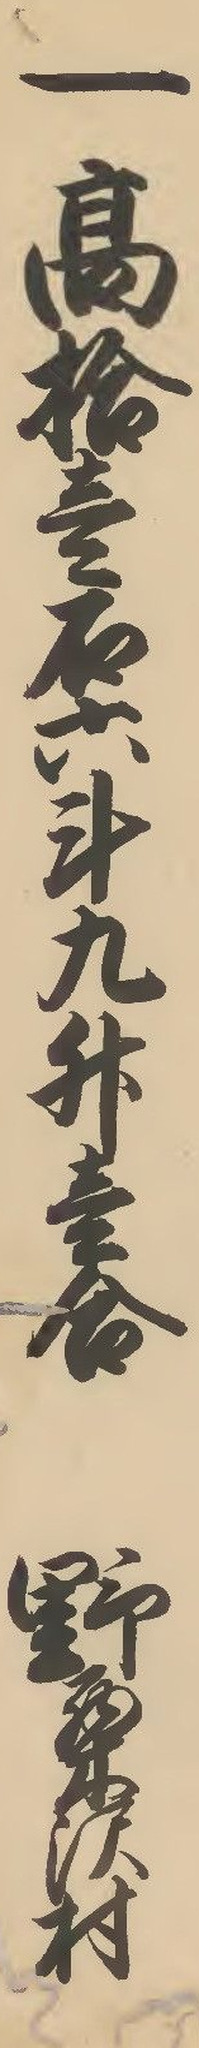一髙拾壱石六斗九升壱合野栗沢村

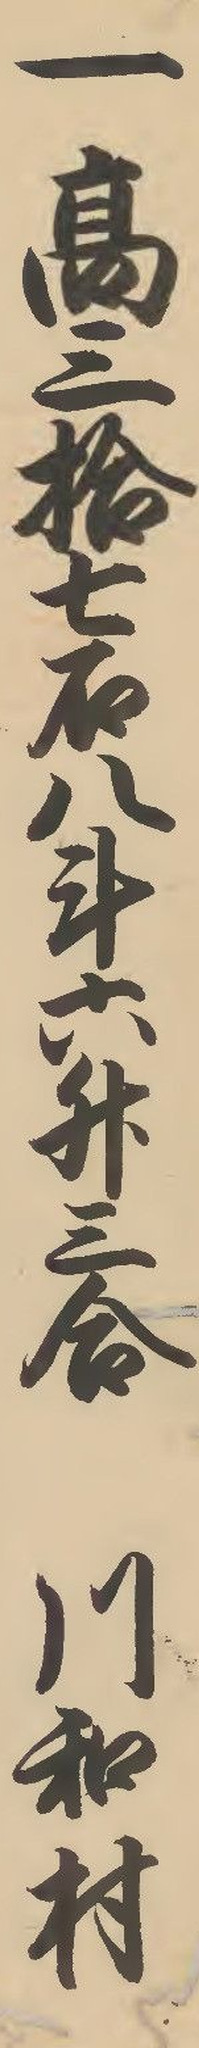一髙三拾七石八斗六升三合川和村
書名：上野国郷帳
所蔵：国立公文書館 National Archives of Japan
